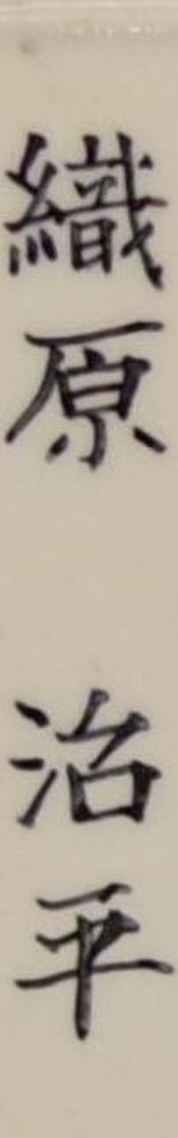織原治平
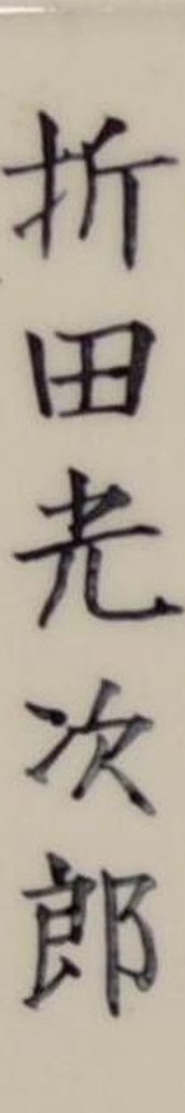折田光次郎
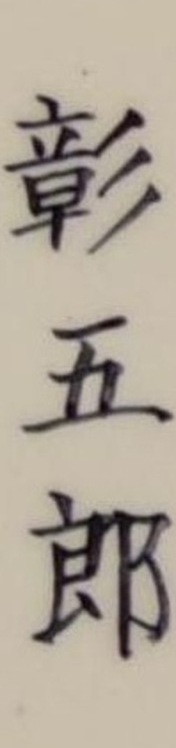彰五郎
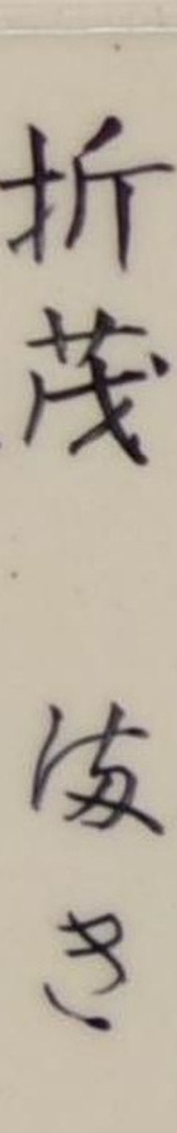折茂まき
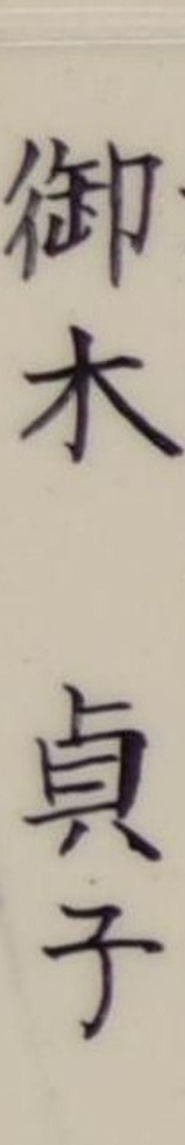御木貞子

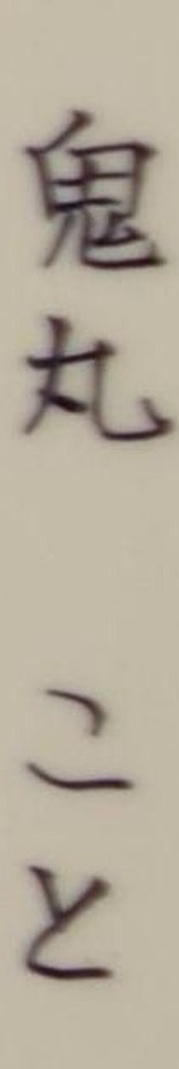鬼丸こと
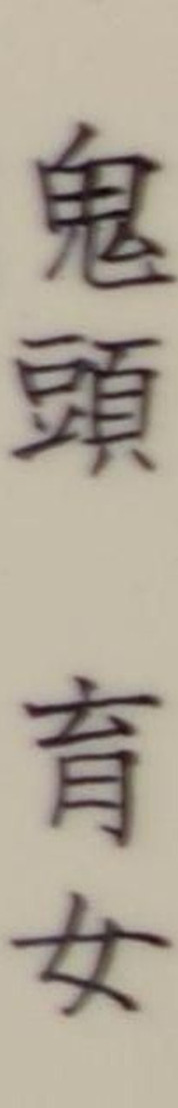鬼頭育女
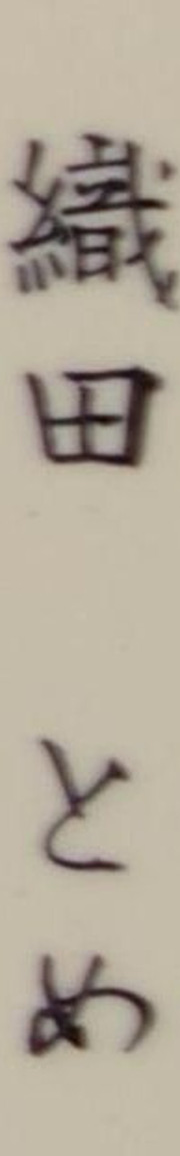織田とめ
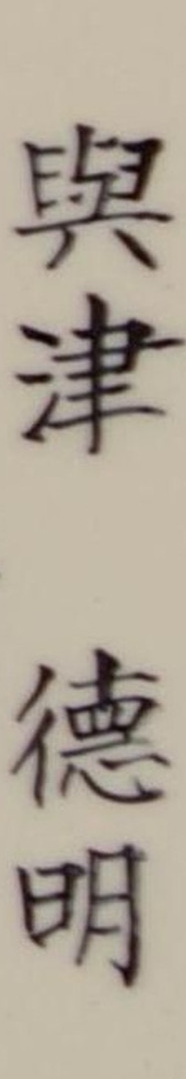與津徳明
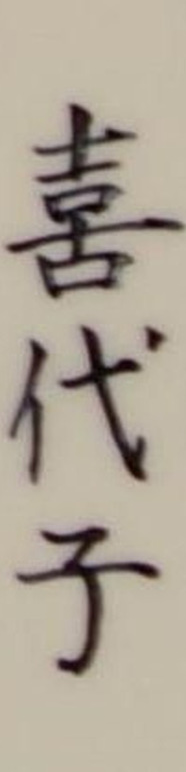喜代子
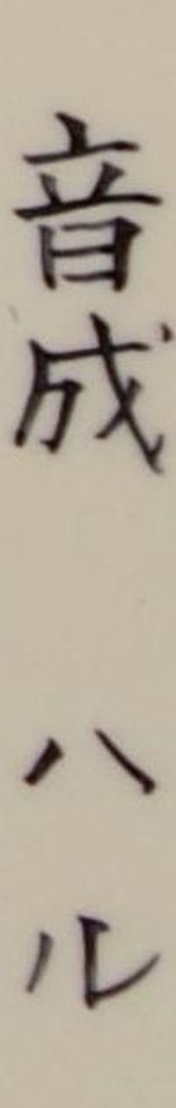音成ハル
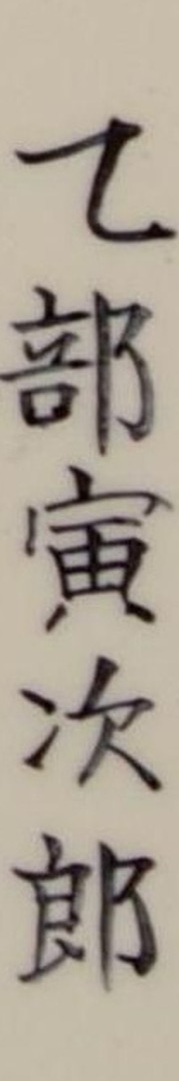乙部寅次郎
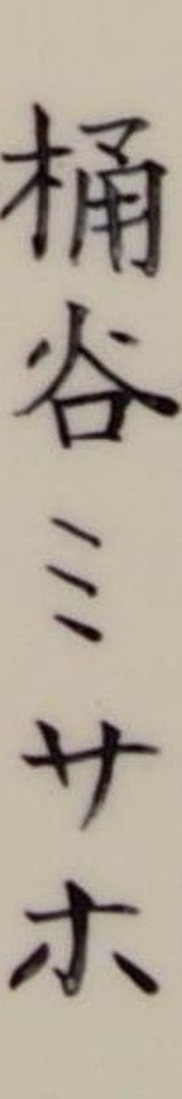桶谷ミサホ
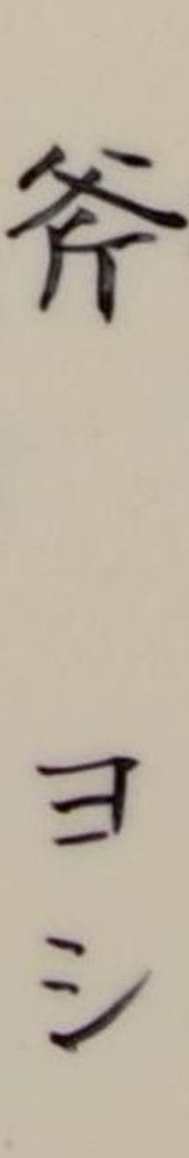斧ヨシ
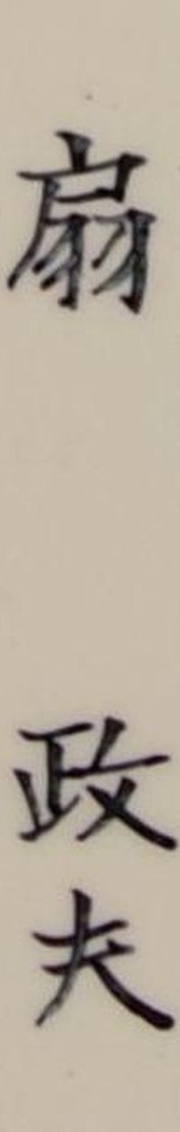扇政夫
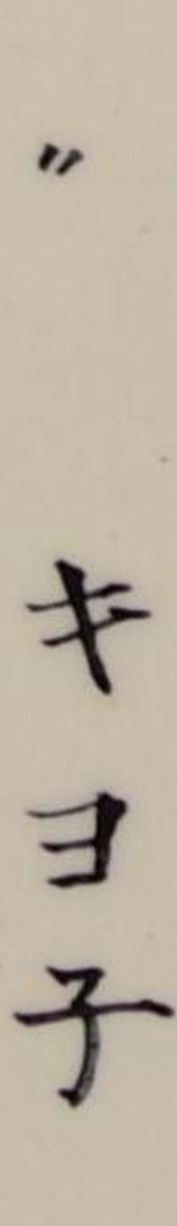キヨ子
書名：E~L
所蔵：高野山金剛峯寺
